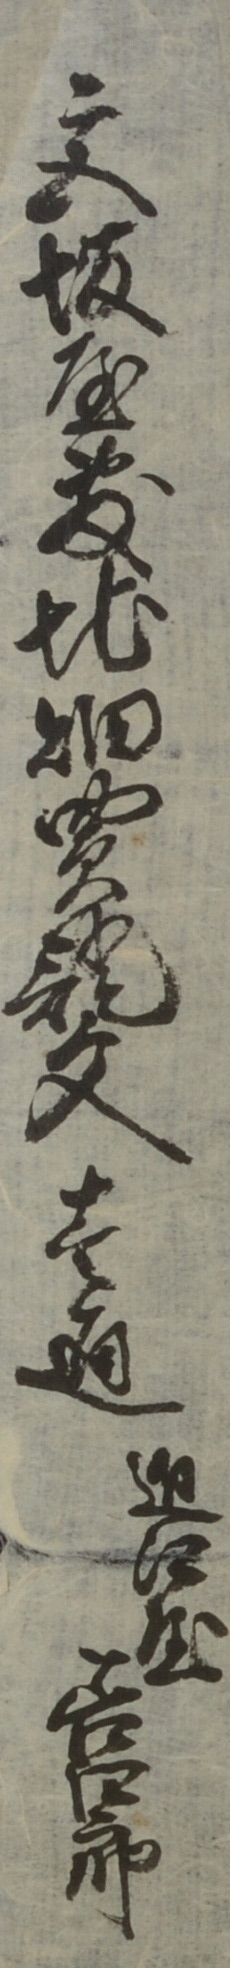宮坂屋敷地畑買証文壱通近江屋善四郎

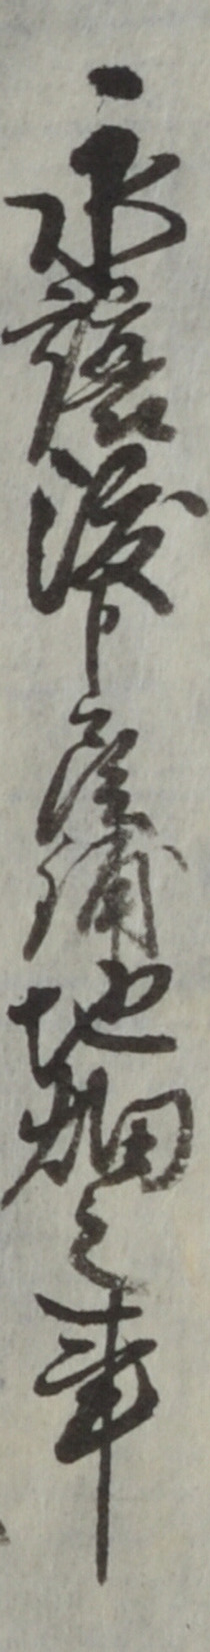永譲渡申屋鋪地畑之事
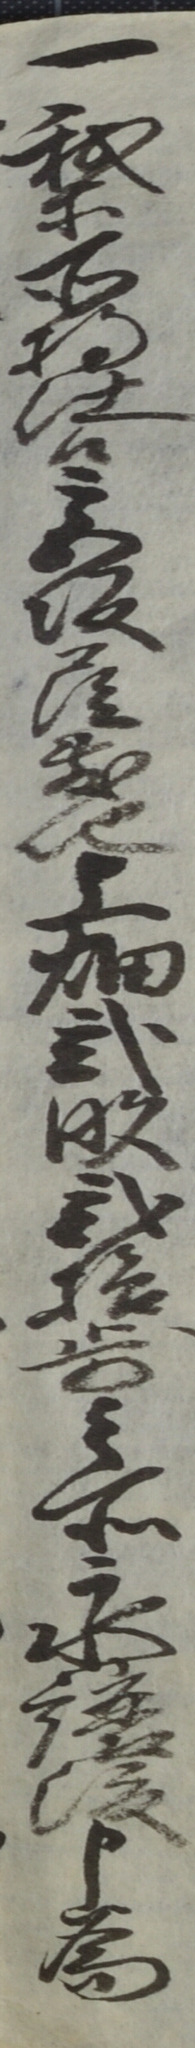一我等所持仕候宮坂屋敷地上畑弐畝弐拾歩之所永譲渡申為
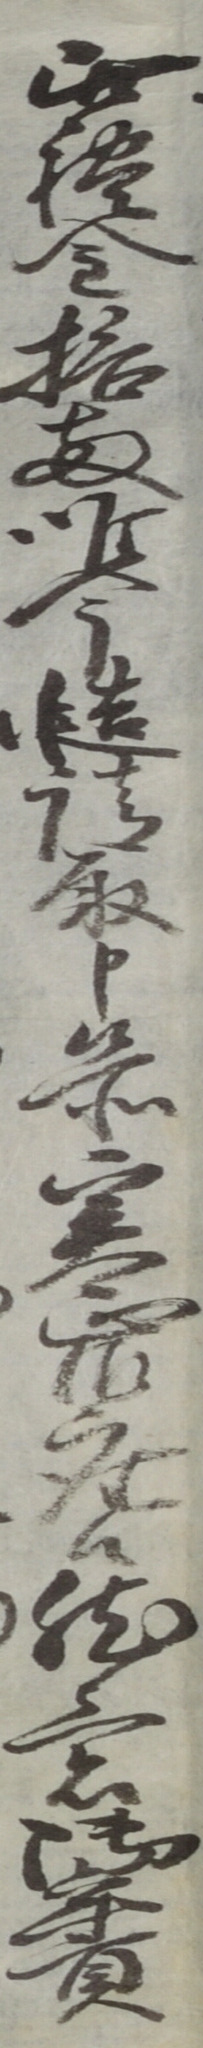此礼金拾両唯今慥請取申候所実正御座候然上者御年貢
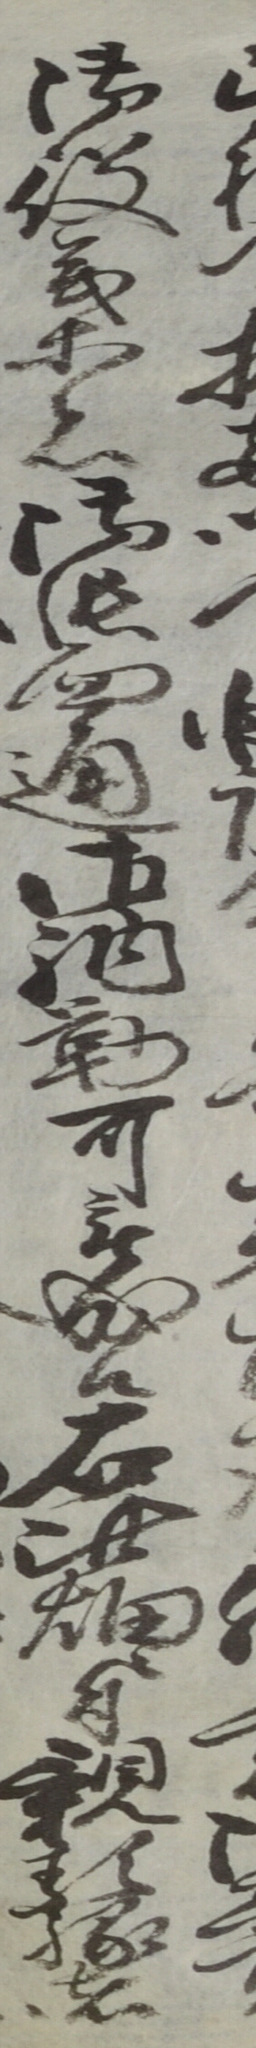御役義等者御帳面通御納勤可被成候右此畑ニ付親類縁者
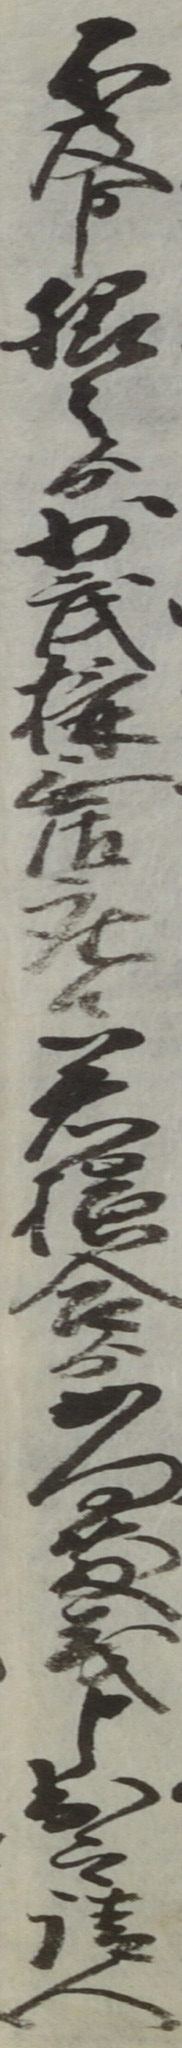不及申脇々ゟ少茂構無御座候若横合ゟ如何敷義申出候
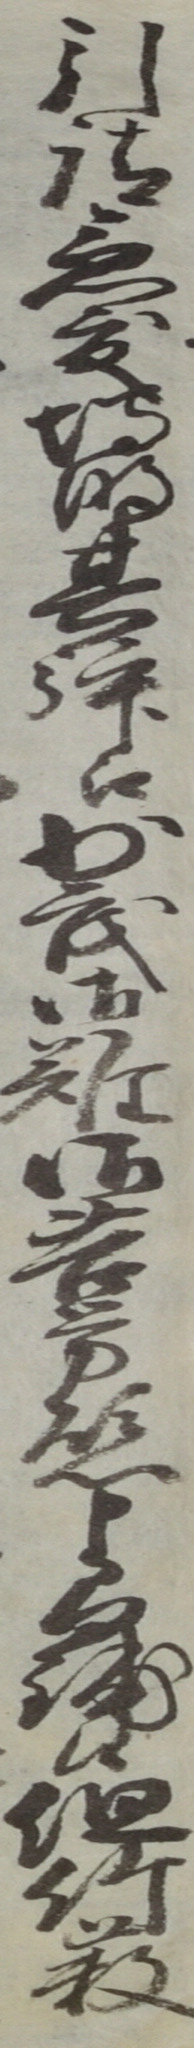引請急度埒明其許江少茂御難御苦労懸申間鋪候但竹藪
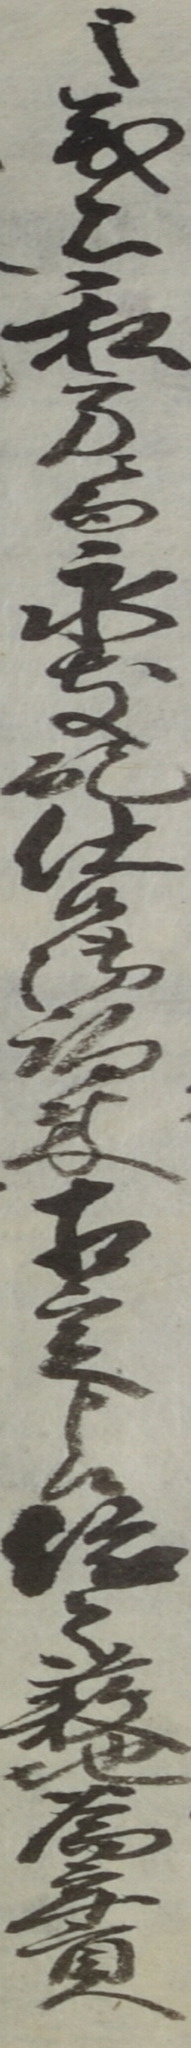之義者私方ニ而永支配仕候御約束相定申候依之薮地為
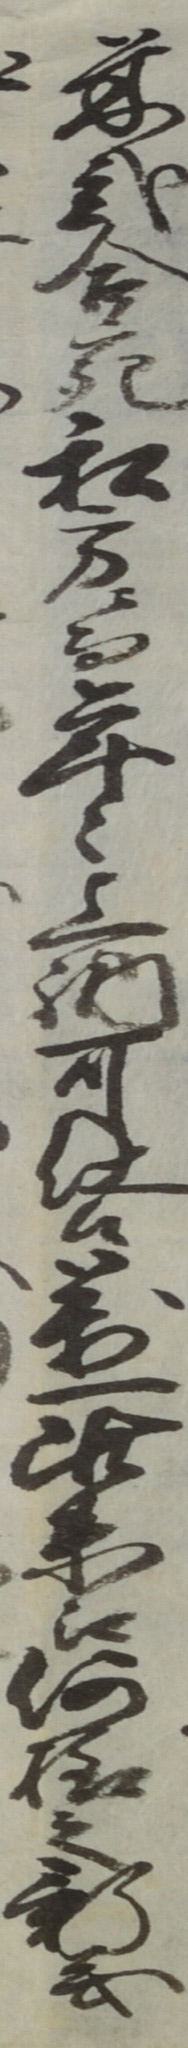米弐合宛私方ニ而年々上納可仕候万一此末江何様之新
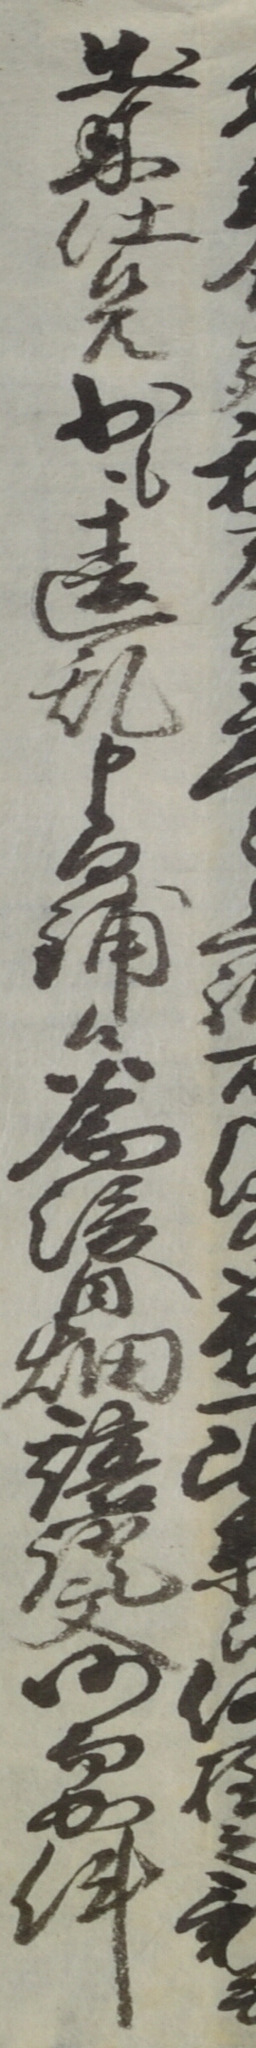出来仕候共少も違乱申間鋪候為後日畑譲証文仍而如件
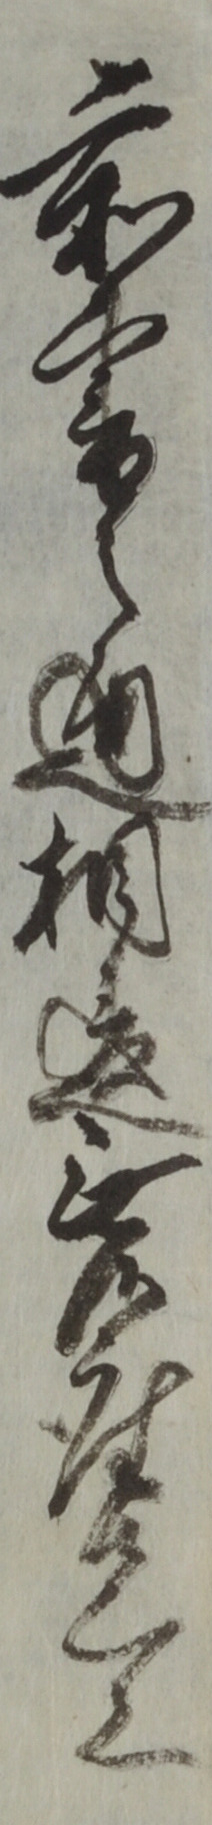前書之通相違無御座候以上
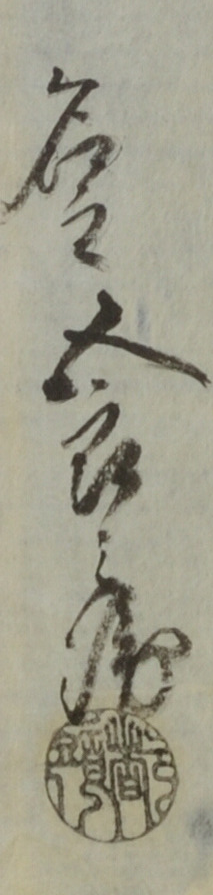名主五郎兵衛㊞
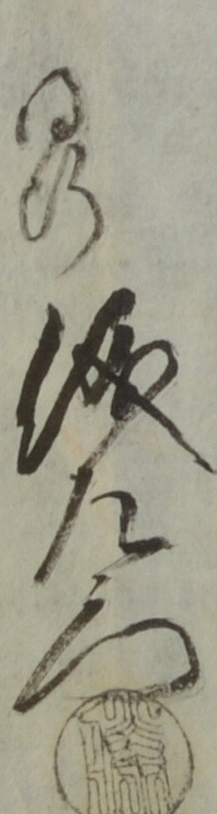同断儀左衛門㊞
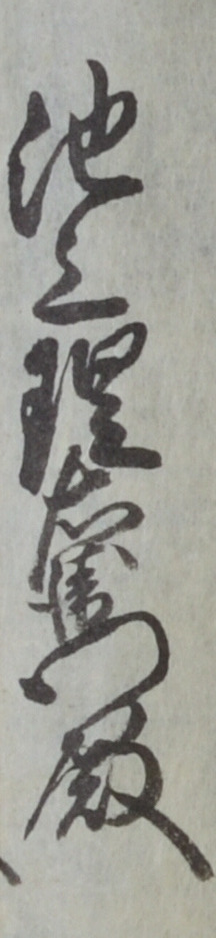池上理右衛門殿
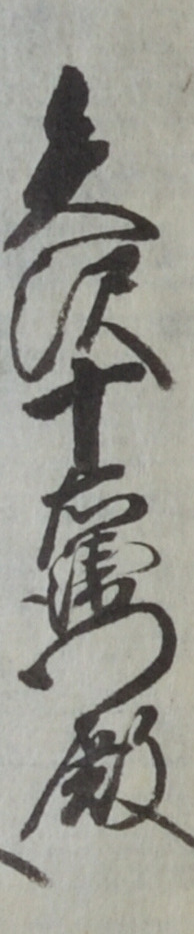矢沢十右衛門殿
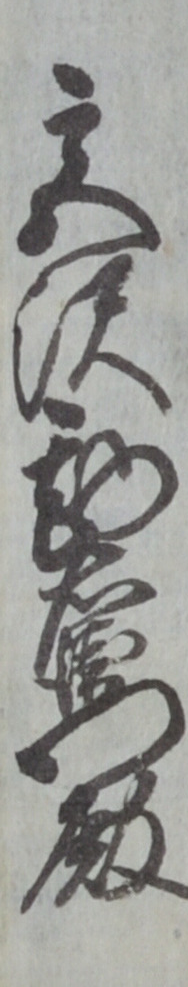宮沢勘右衛門殿
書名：永譲渡申屋敷地之事
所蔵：伊那市立高遠町図書館・合同会社AMANE
